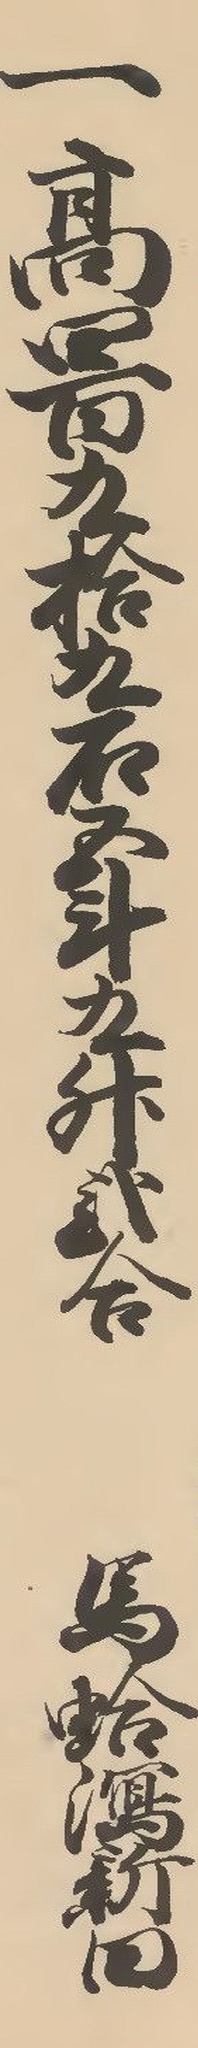一髙四百九拾九石五斗九升弐合馬蛤潟新田
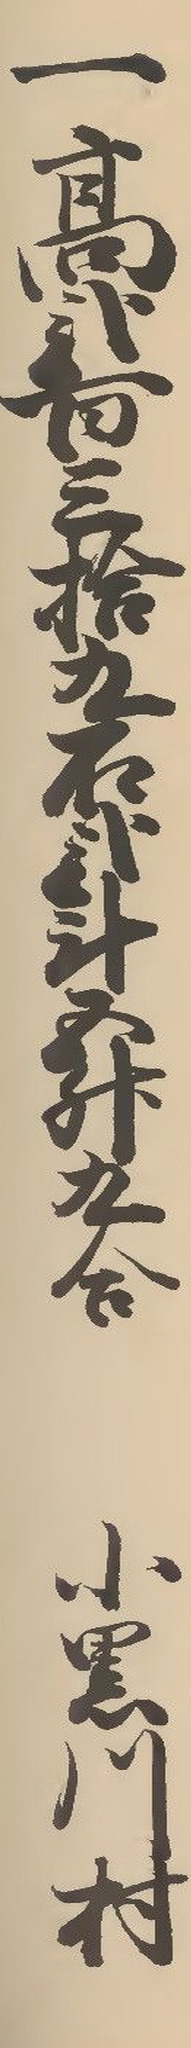一髙弐百三拾九石弐斗五升九合小黑川村
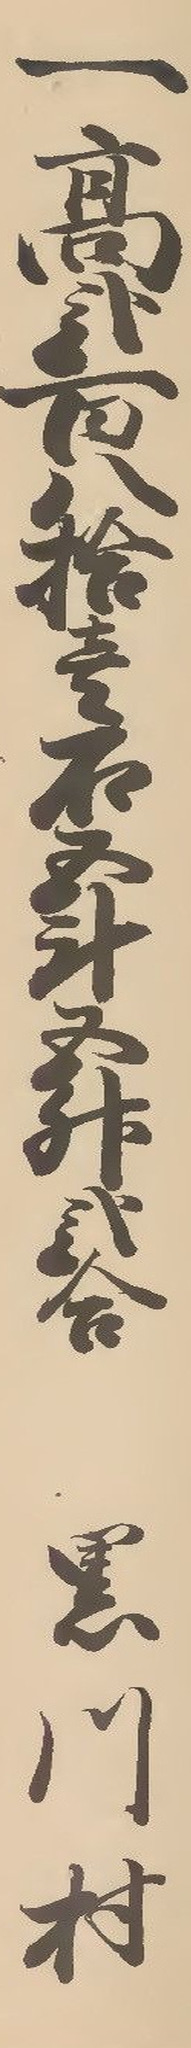一髙弐百八拾壱石五斗五升弐合黑川村
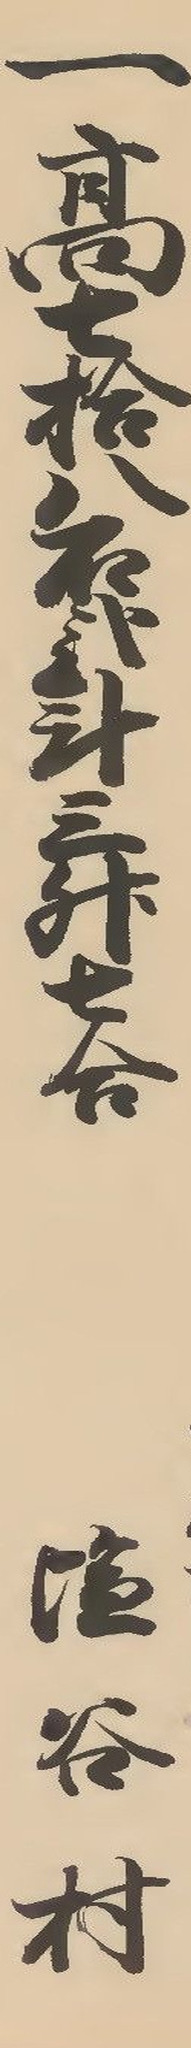一髙七拾八石弐斗三升七合塩谷村
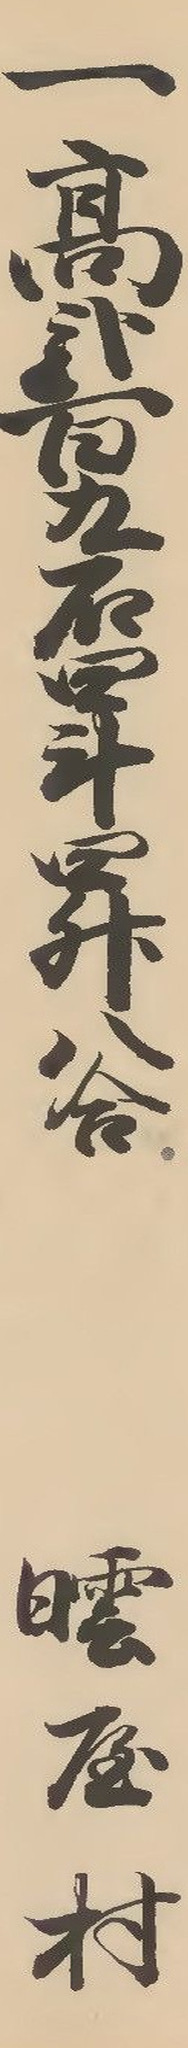一髙弐百九石四斗四升八合屋村
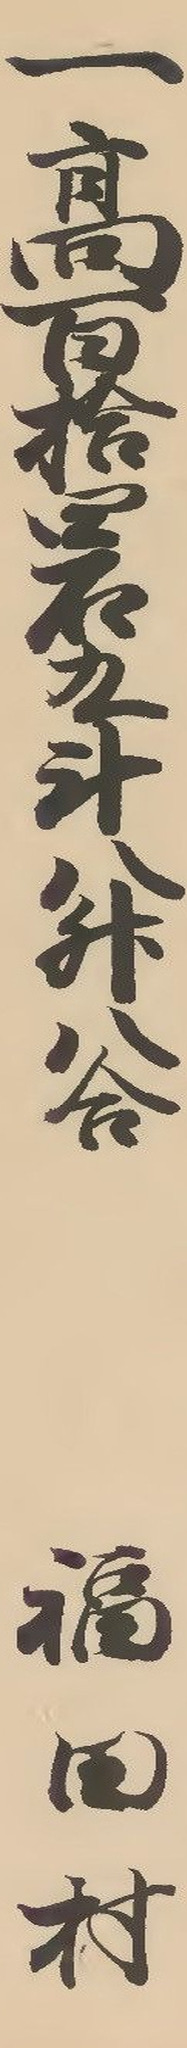一髙百拾四石九斗八升八合福田村

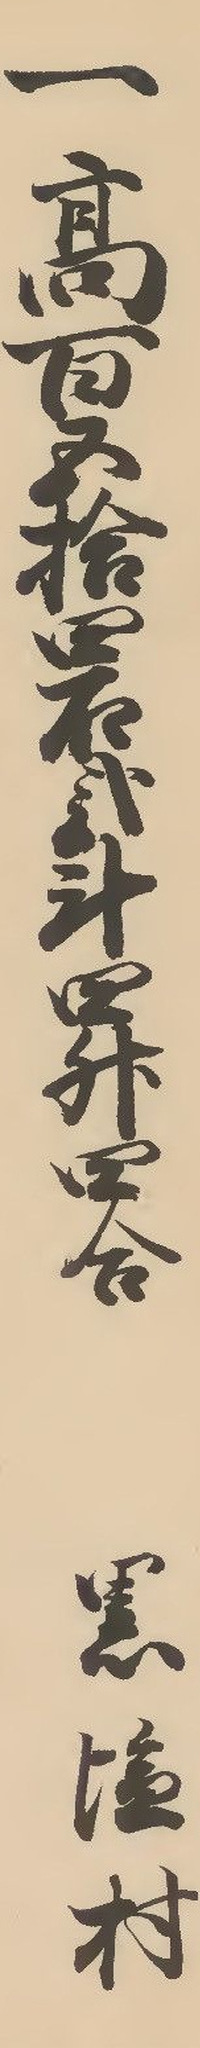一髙百五拾四石弐斗四升四合黑塩村
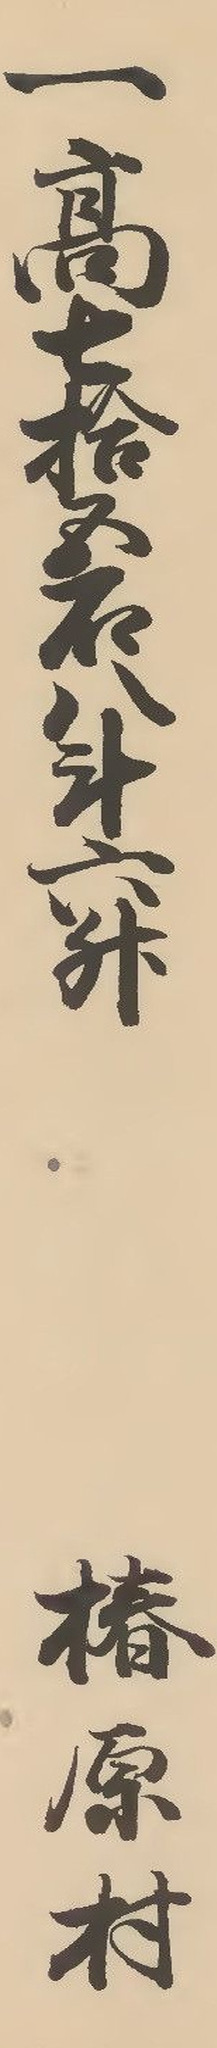一髙七拾五石八斗六升椿原村
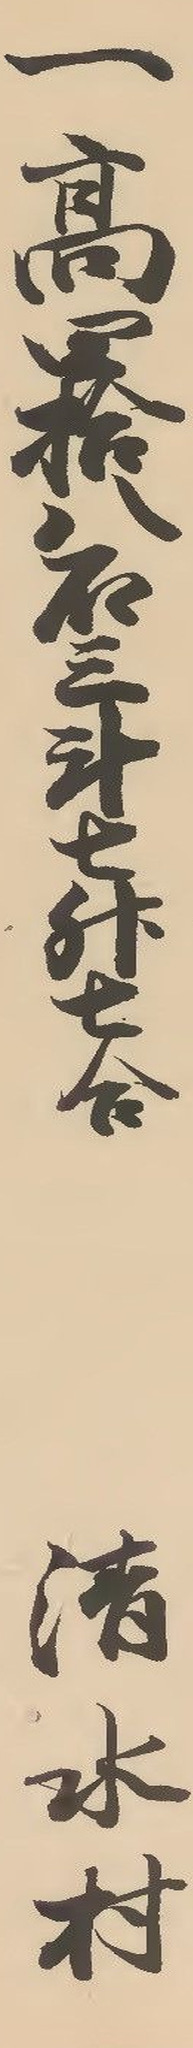一髙四拾八石三斗七升七合清水村
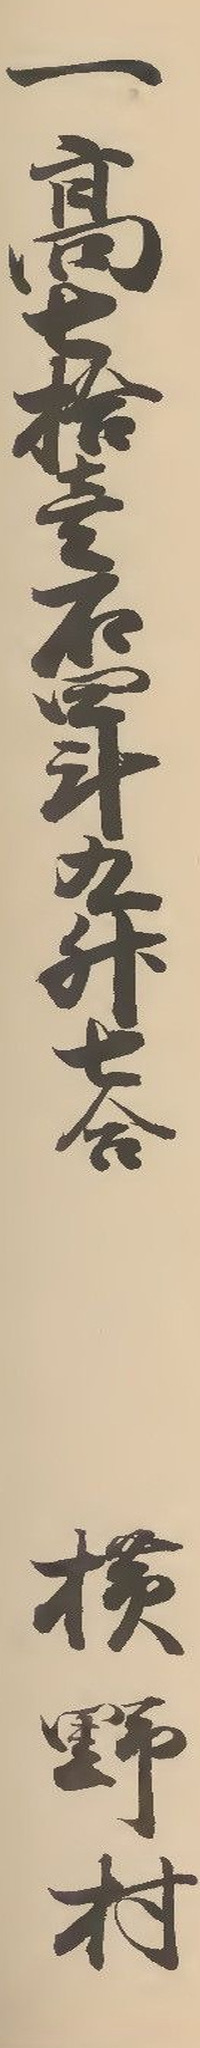一髙七拾壱石四斗九升七合横野村
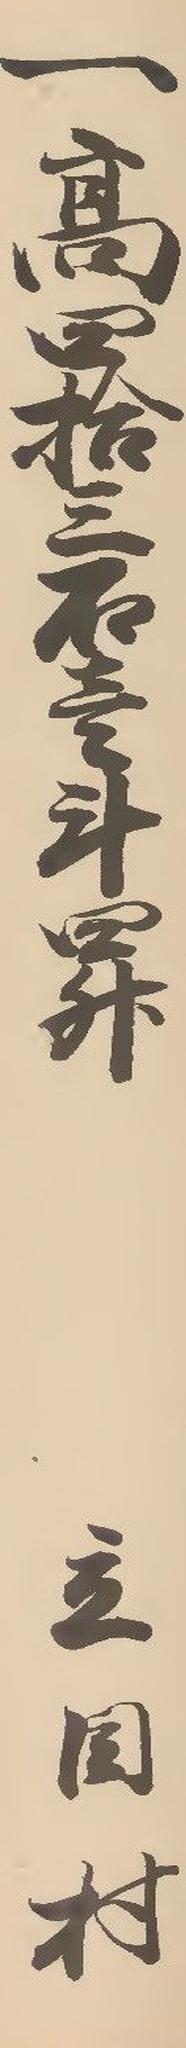一髙四拾三石壱斗四升立目村
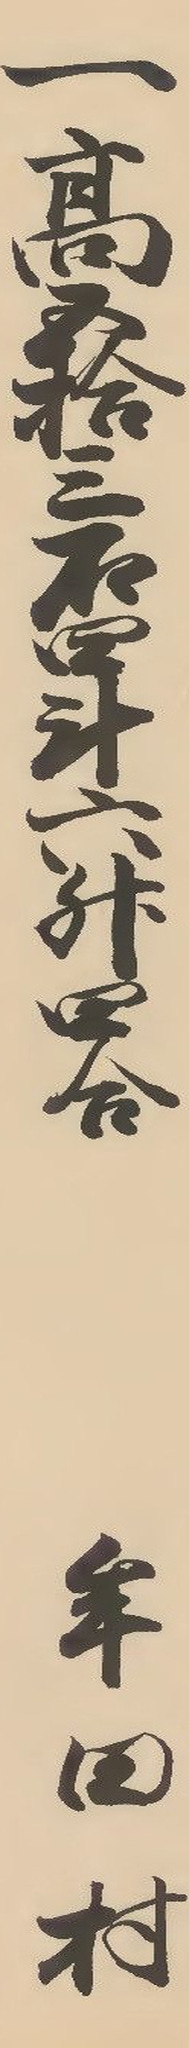一髙五拾三石四斗六升四合牟田村
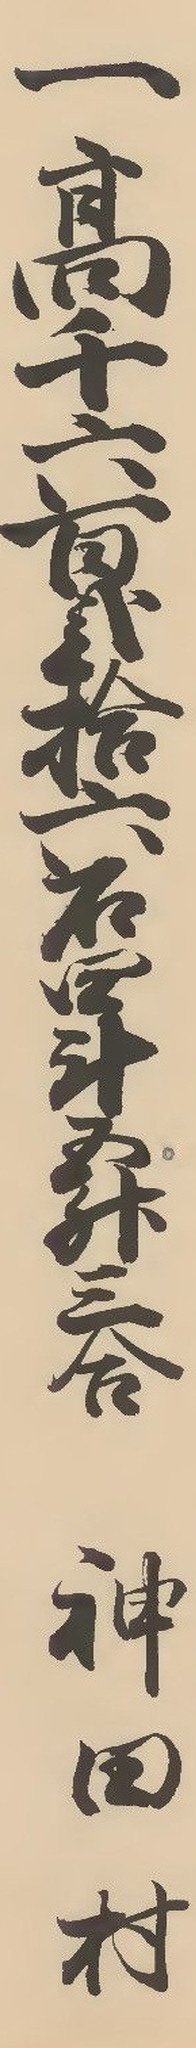一髙千六百弐拾六石四斗五升三合神田村
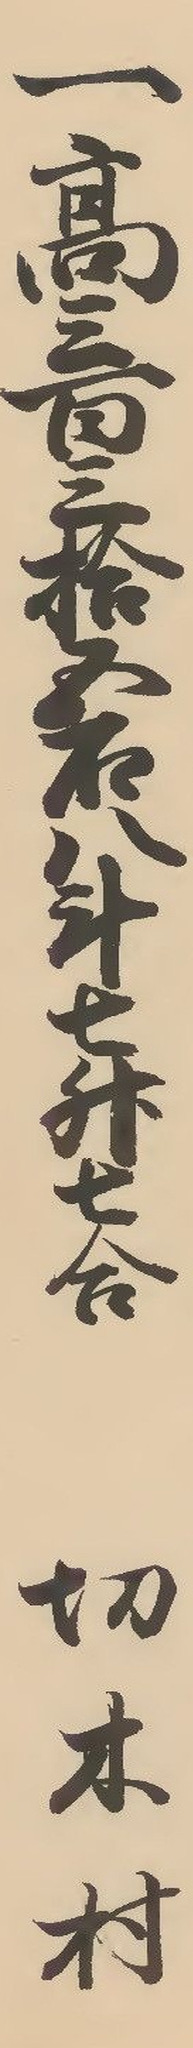一髙三百三拾五石八斗七升七合切木村

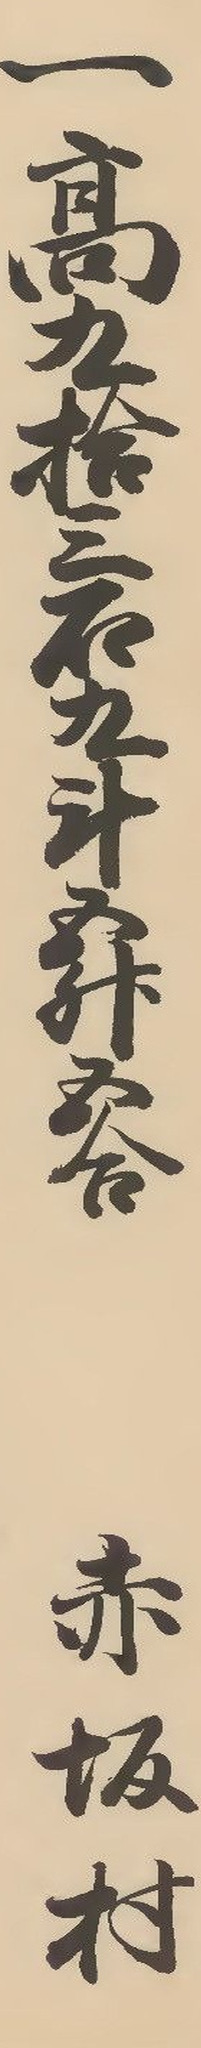一髙九拾三石九斗五升五合赤坂村
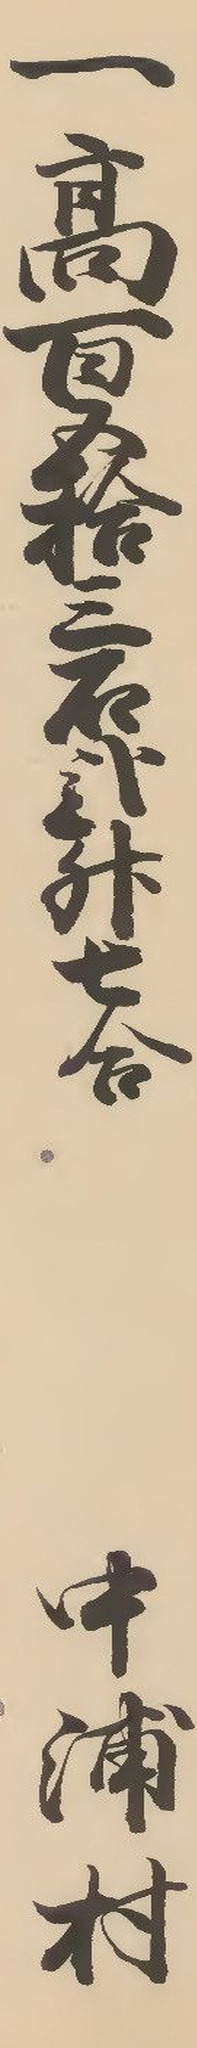一髙百五拾三石弐升七合中浦村
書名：肥前国郷帳
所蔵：国立公文書館 National Archives of Japan
